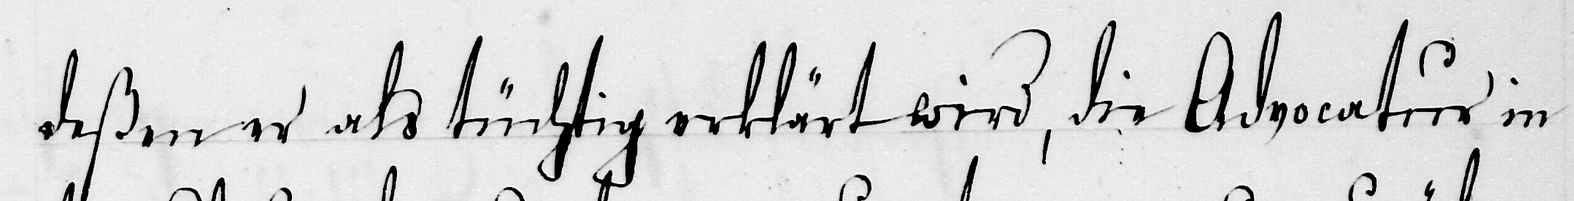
deßen er als tüchtig erklärt wird, die Advocatur in
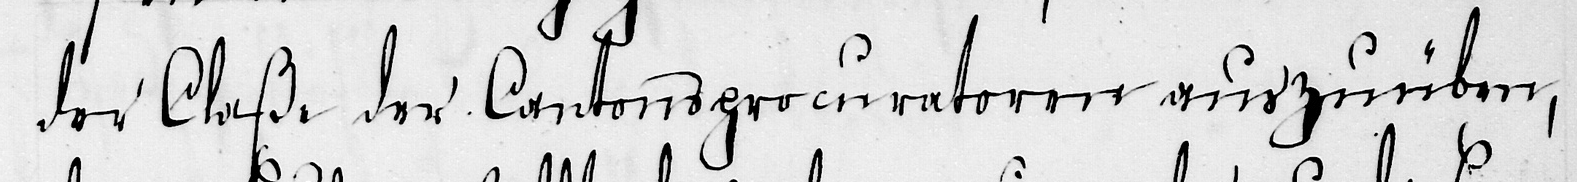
der Claße der Cantonsprocuratoren auszuüben,
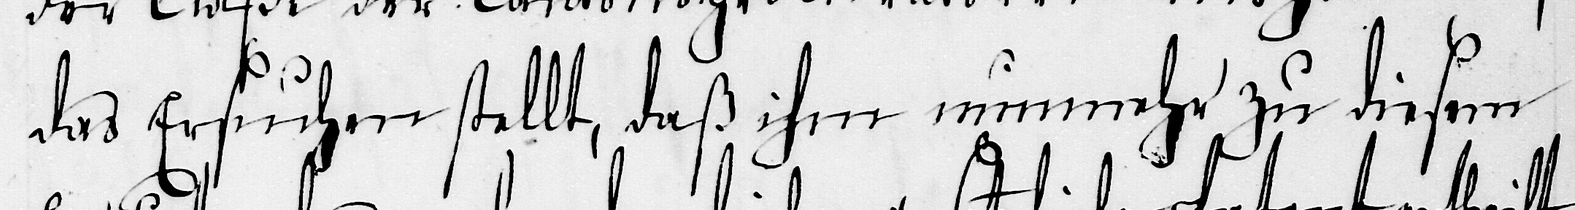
das Ersuchen stellt, daß ihm nunmehr zu diesem
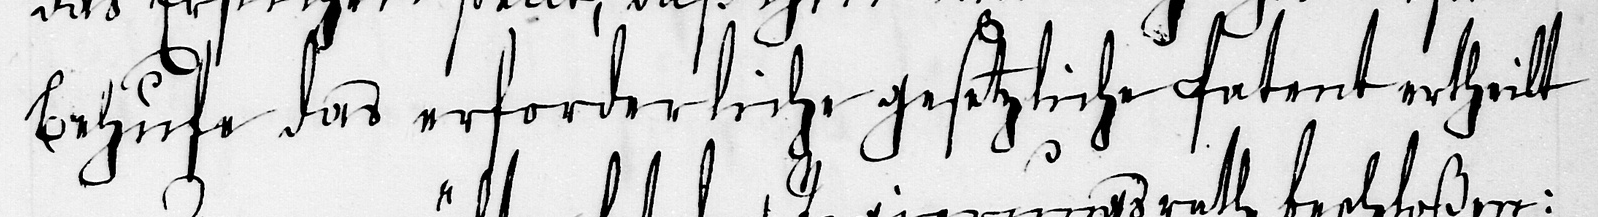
Behufe das erforderliche gesetzliche Patent ertheilt
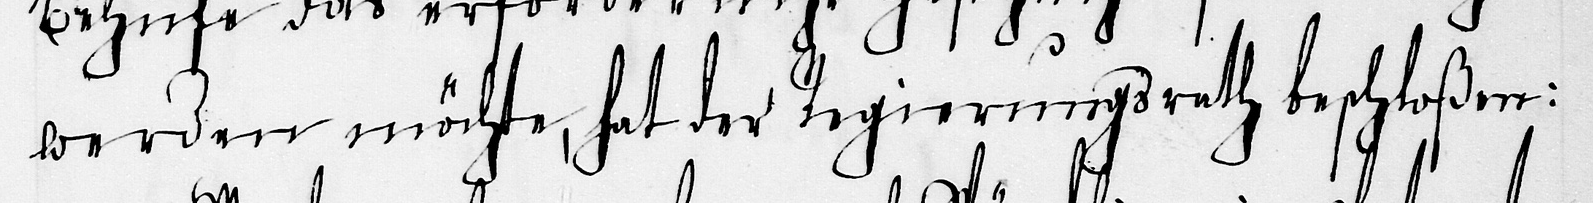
werden möchte, hat der Regierungsrath beschloßen:
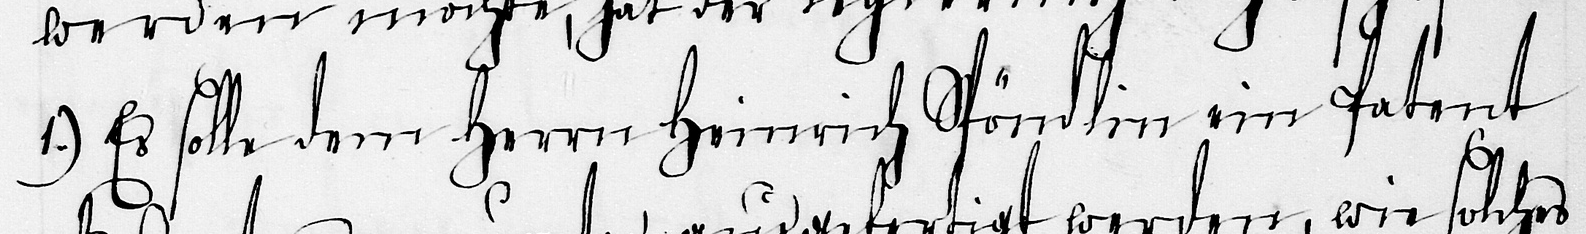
Es solle dem Herrn Heinrich Spöndlin ein Patent
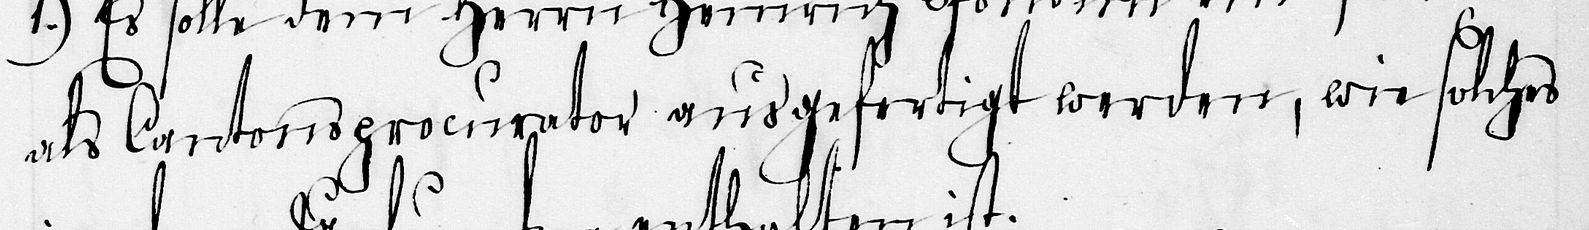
als Cantonsprocurator ausgefertigt werden, wie solches
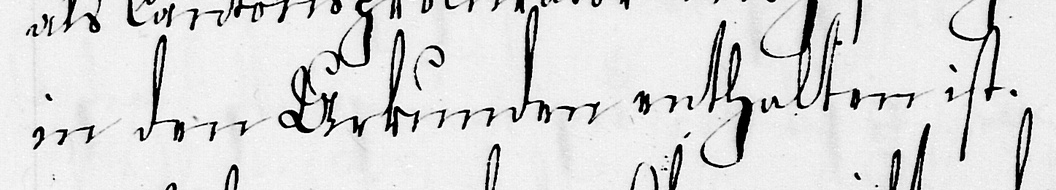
in den Urkunden enthalten ist.
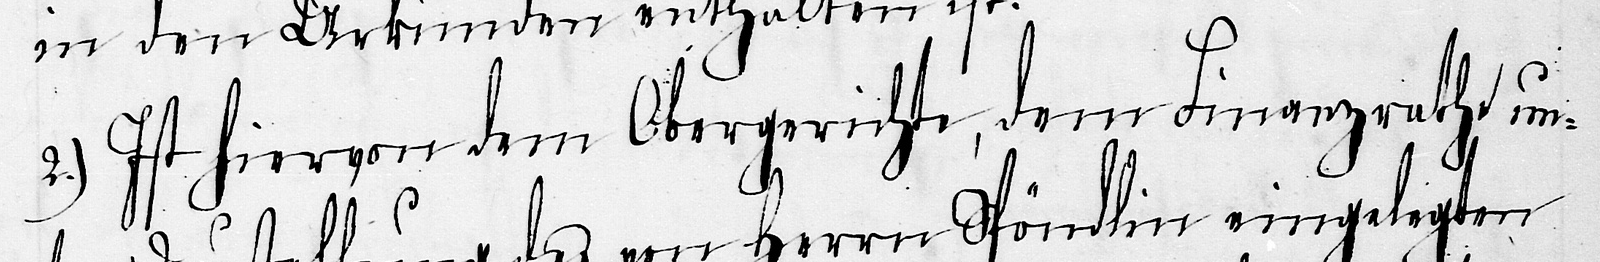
2.) Ist hiervon dem Obergerichte, dem Finanzrathe un¬
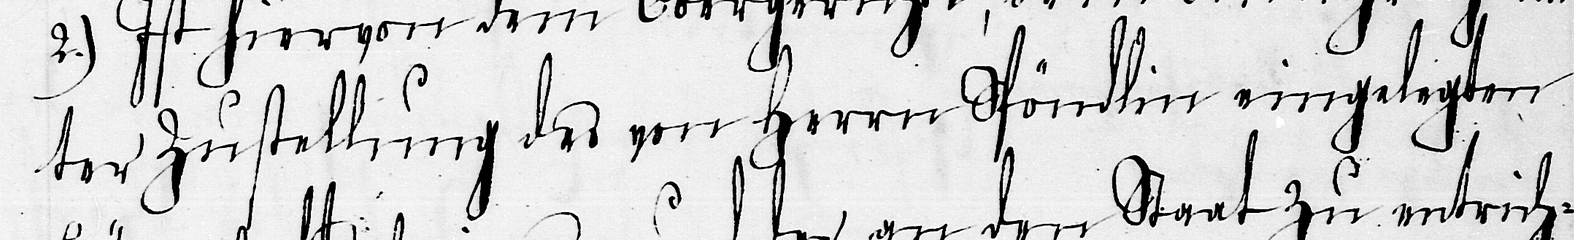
ter Zustellung des von Herrn Spöndlin eingelegten
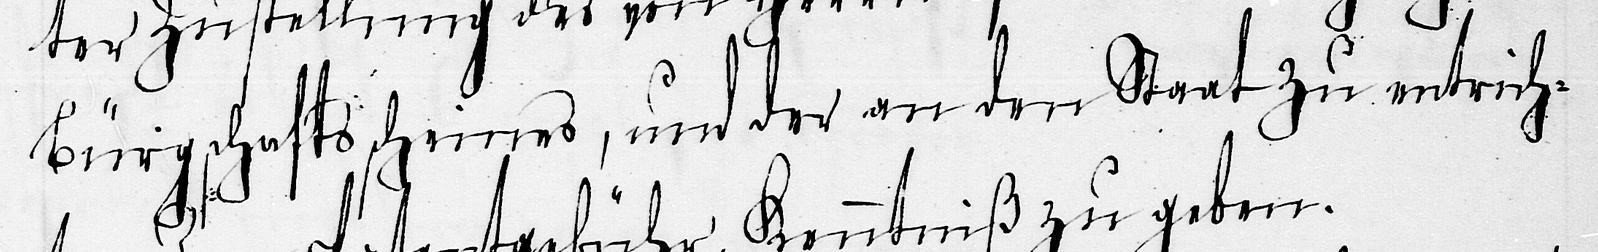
Bürgschaftsscheines, und der an den Staat zu entrich¬
